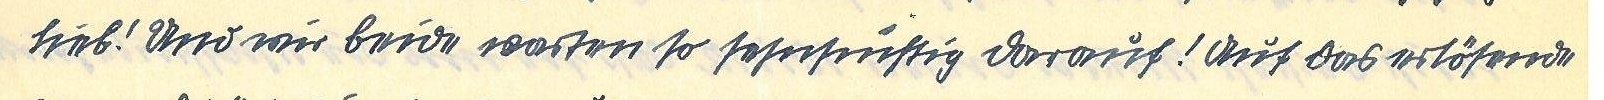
zlieb! Und wir beide warten so sehnsüchtig darauf! Auf das erlösende
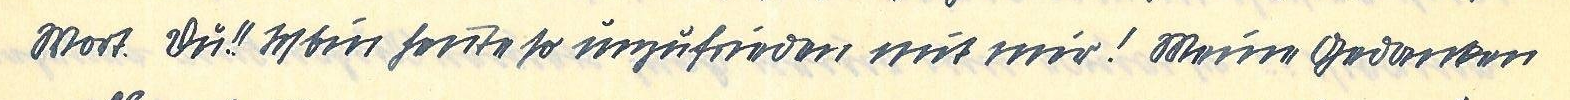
Wort. Du!! Ich bin heute so unzufrieden mit mir! Meine Gedanken
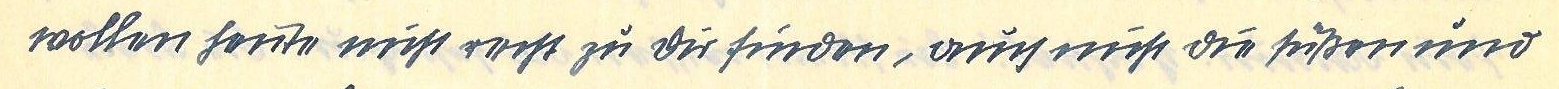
wollen heute nicht so recht zu Dir finden, auch nicht die süßen und
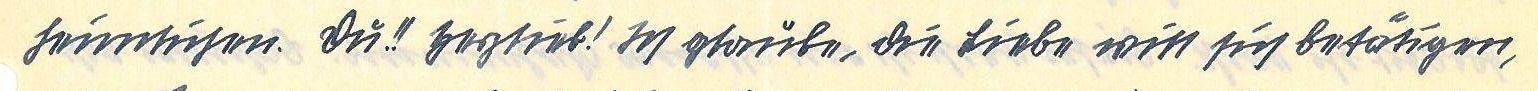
heimlichen. Du!! Herzlieb! Ich glaube, die Liebe will sich betätigen,
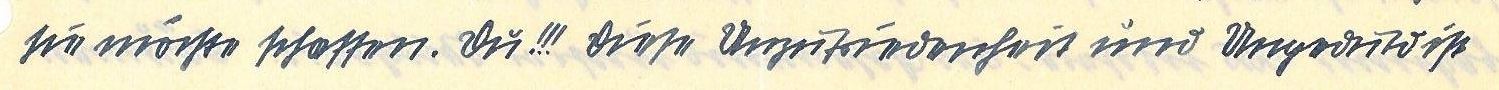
sie möchte schaffen. Du!!! Diese Unzufriedenheit und Ungeduld ist
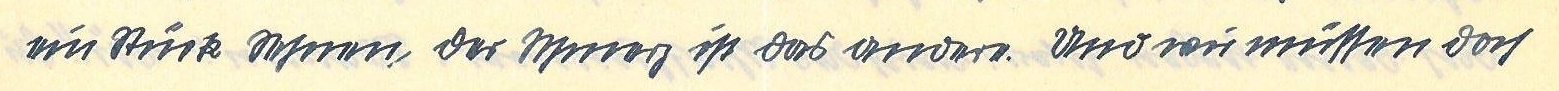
ein Stück Sehnen, der Schmerz ist das andere. Und wir müssen doch
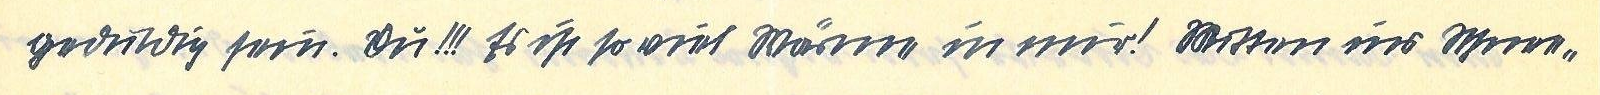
geduldig sein. Du!!! Es ist so viel Wärme in mir! Mitten ins Schnee¬
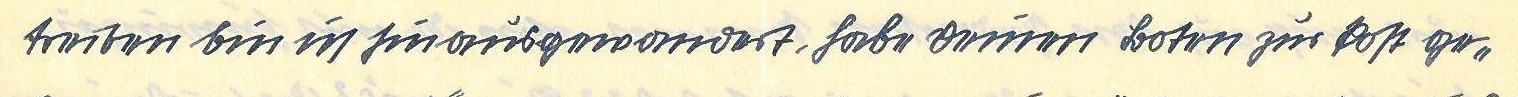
treiben bin ich hinausgewandert, habe Deinen Boten zur Post ge¬
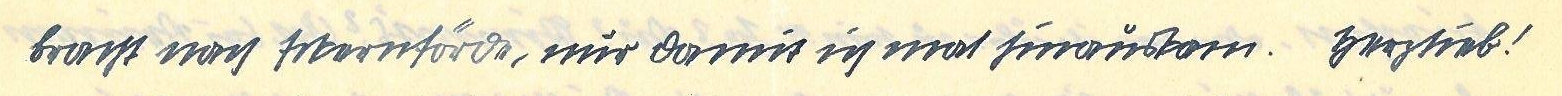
bracht nach E., nur damit ich mal hinauskam. Herzlieb!
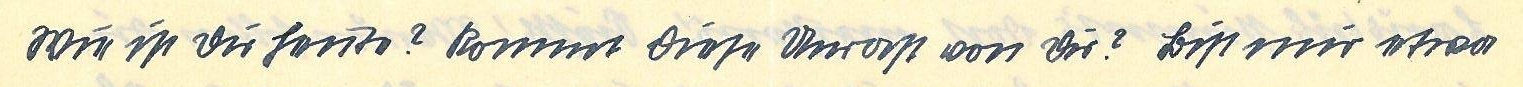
Wie ist Dir heute? Kommt diese Unrast von Dir? Bist mir etwa
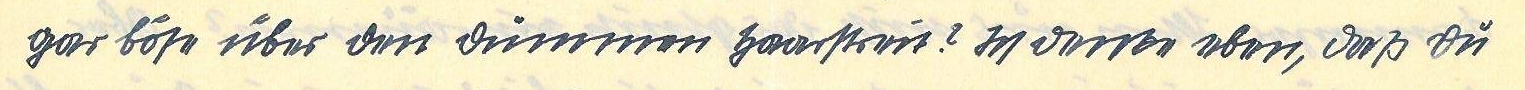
gar böse über den dummen Haarstreit? Ich denke, daß Du
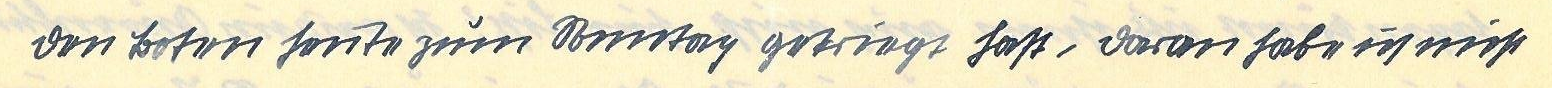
den Boten heute zum Sonntag gekriegt hast, daran habe ich nicht
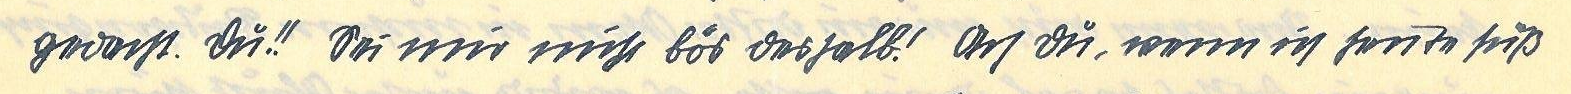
gedacht. Du!! Sei mir nicht bös deshalb! Ach Du, wenn ich heute süß
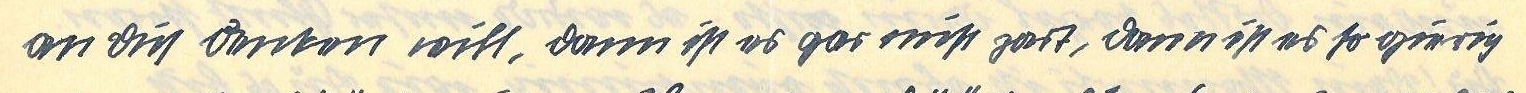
an Dich denken will, dann ist es gar nicht zart, dann ist es gierig
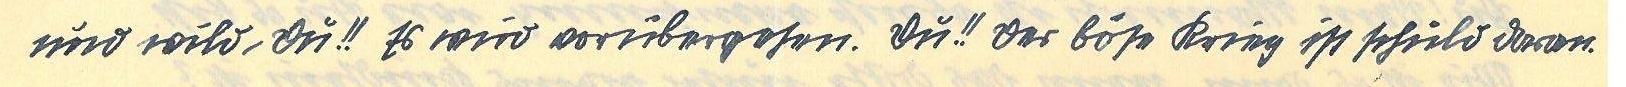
und wild, Du!! Es wird vorübergehen. Du!! Der böse Krieg ist schuld daran.
